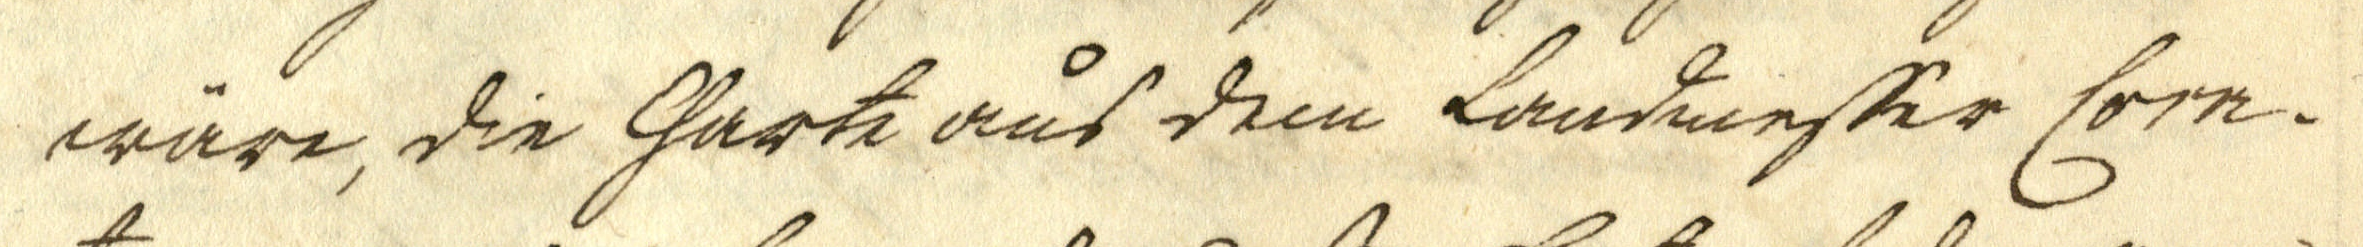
wäre, die Charte aus dem Landmesser Com¬
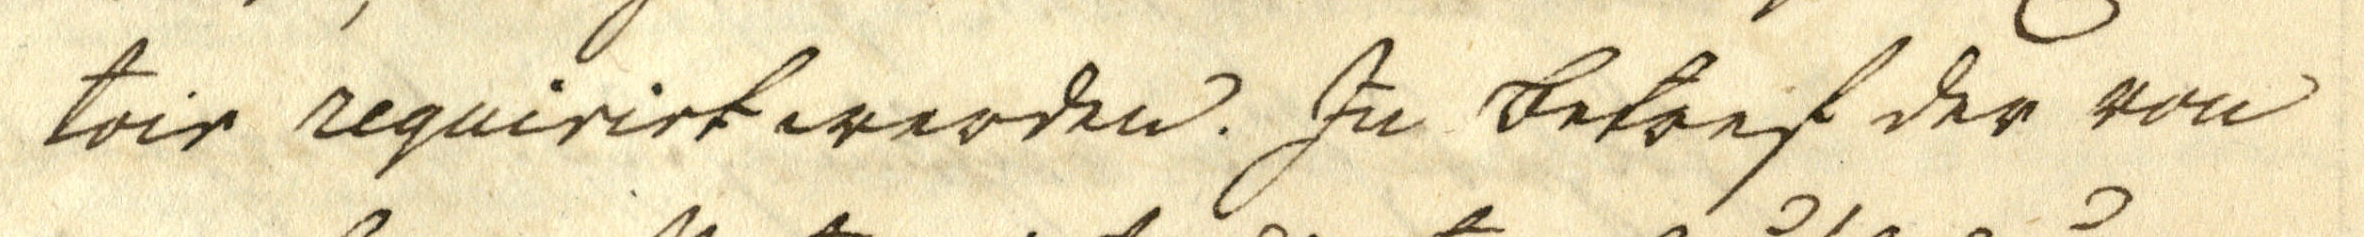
toir requirirt werden. In Betref der von
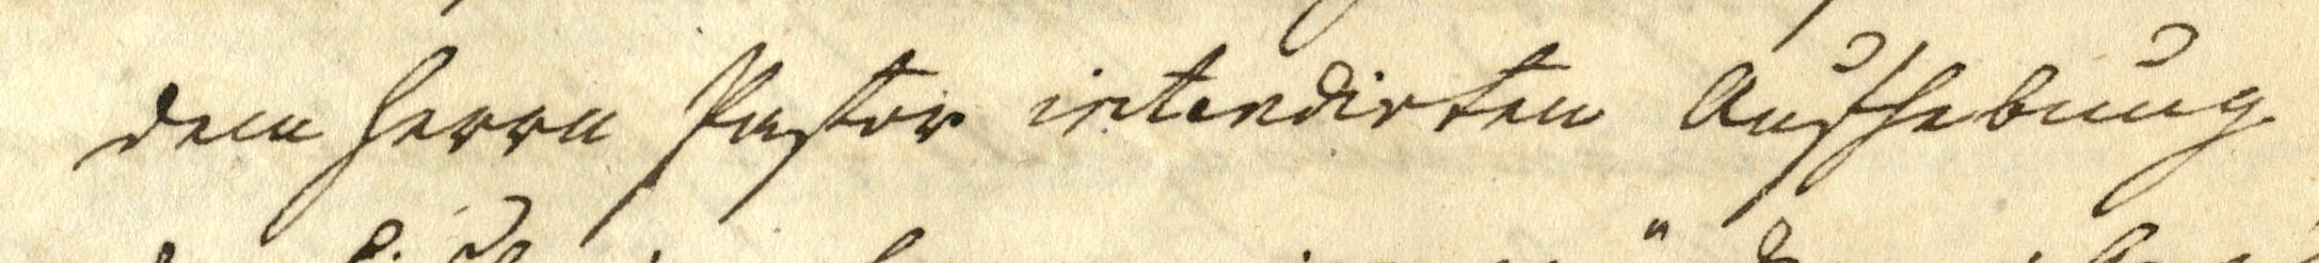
dem Herrn Pastor intendirten Aufhebung
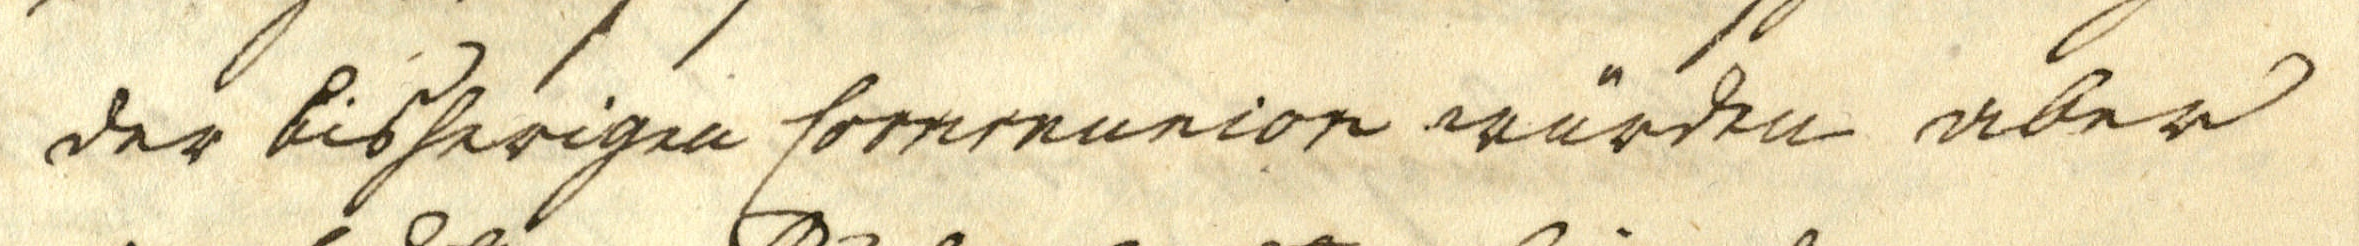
der bisherigen Communion würden aber
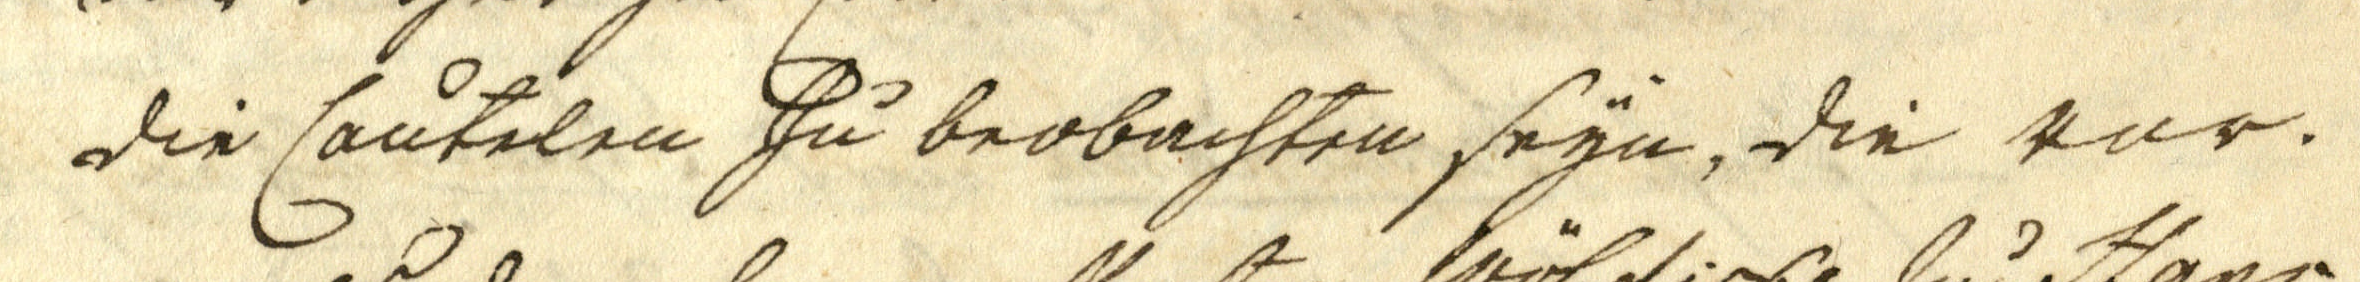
die Cautelen zu beobachten seÿn, die vor¬
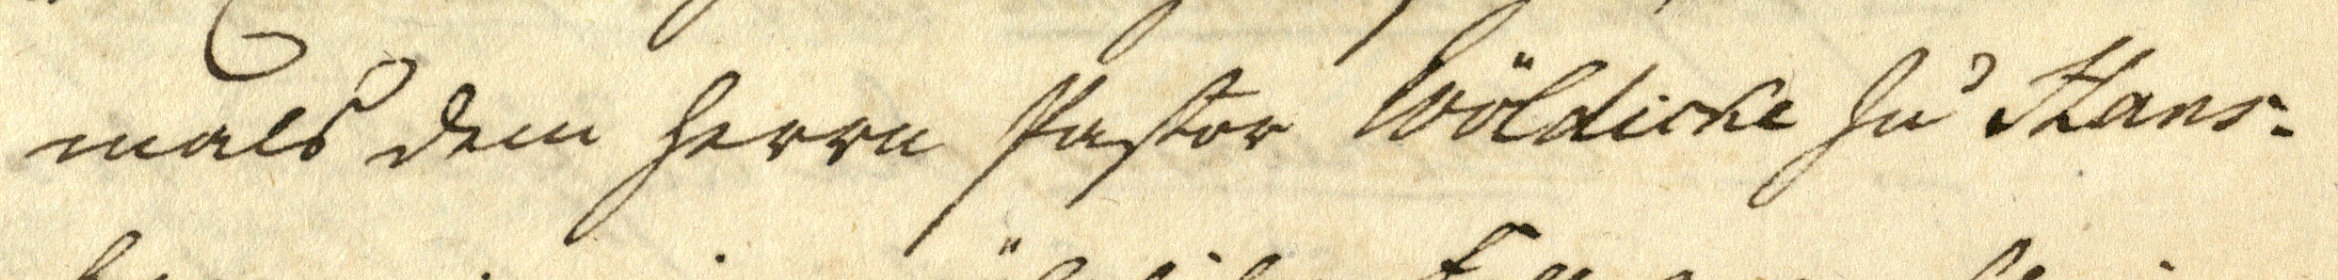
mals dem Herrn Pastor Wöldicke zu Hans¬
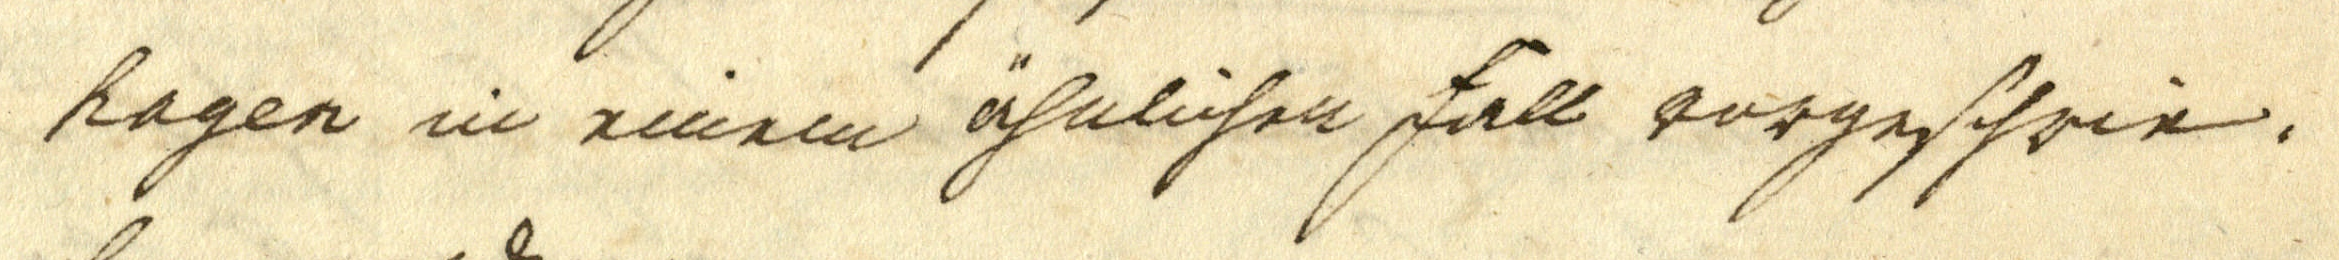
hagen in einem ähnlichen Fall vorgeschrie¬
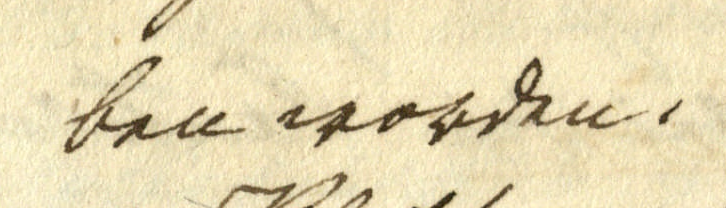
ben worden.
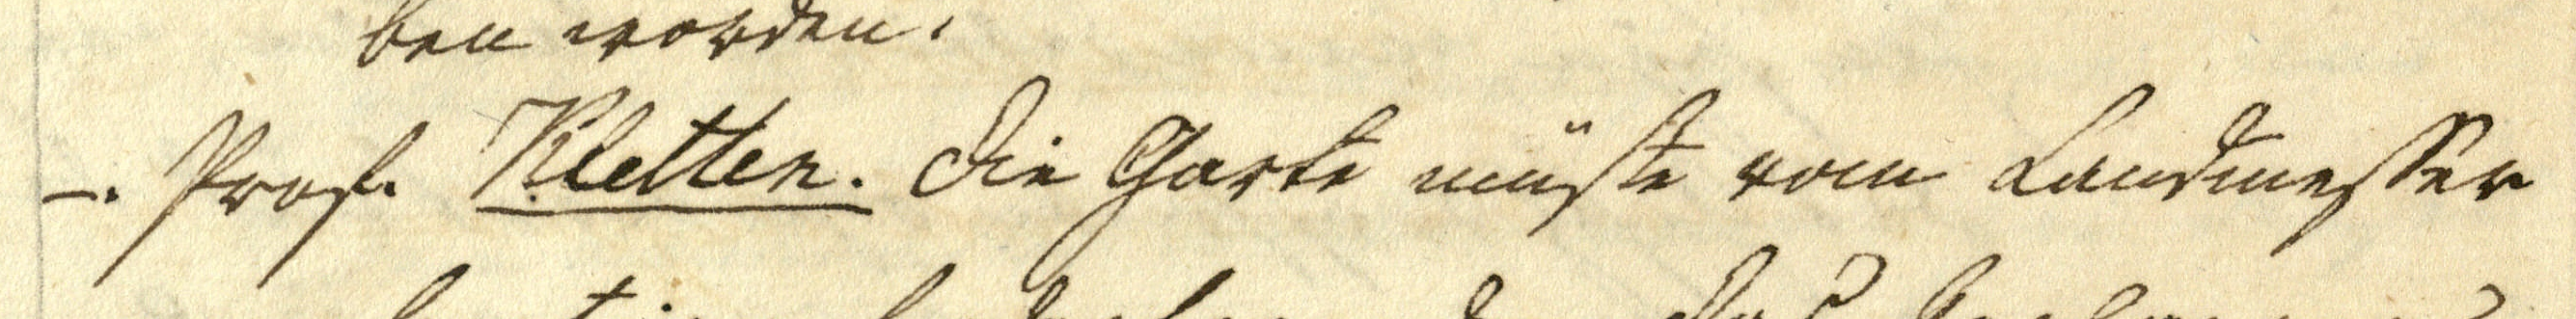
Prof. Kletten. Die Charte müßte vom Landmesser
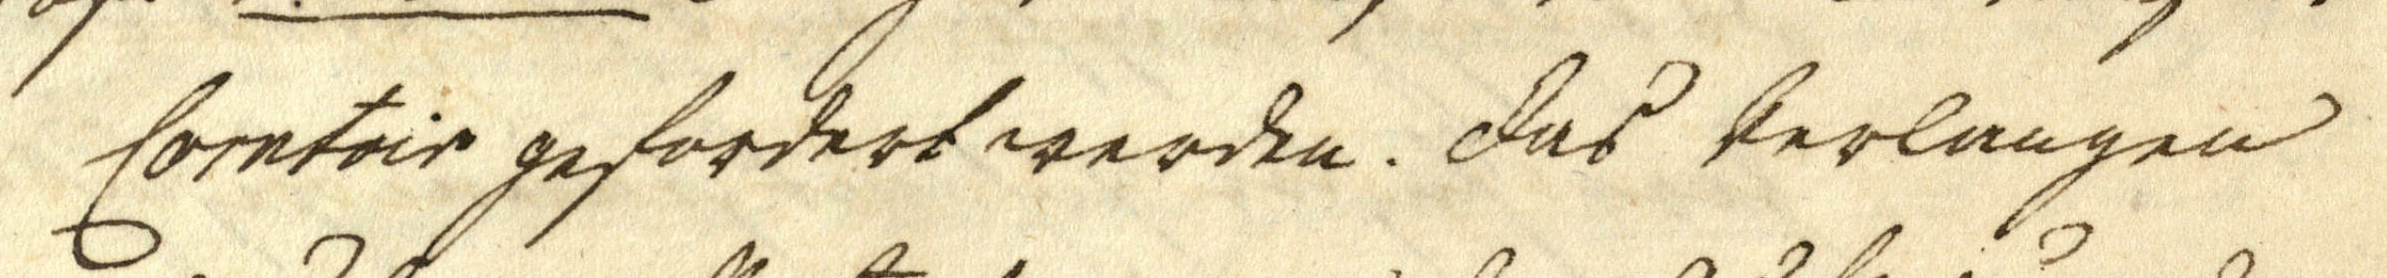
Comtoir gefordert werden. Das Verlangen
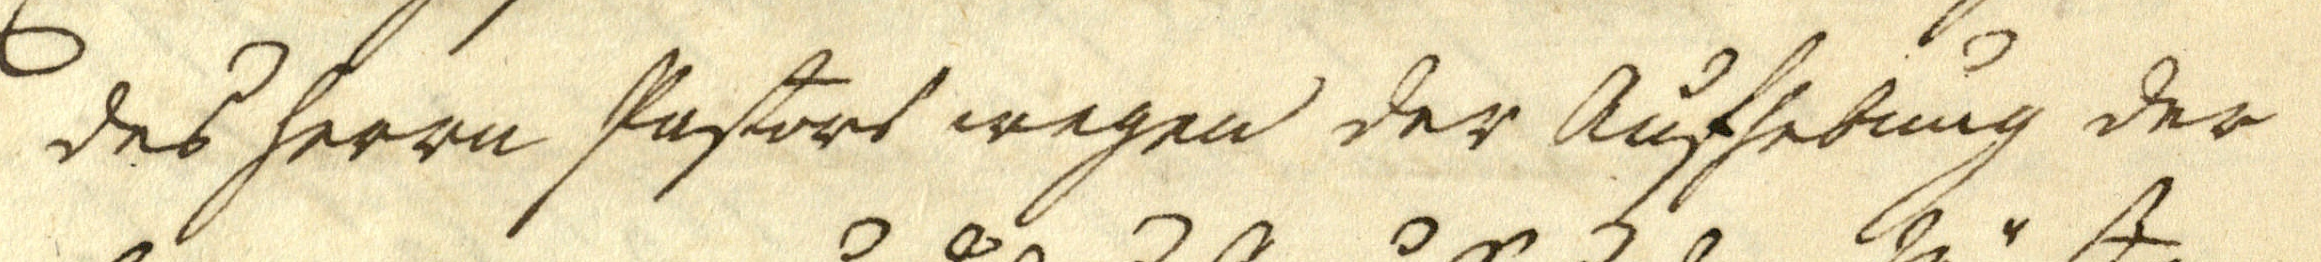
des Herrn Pastors wegen der Aufhebung der
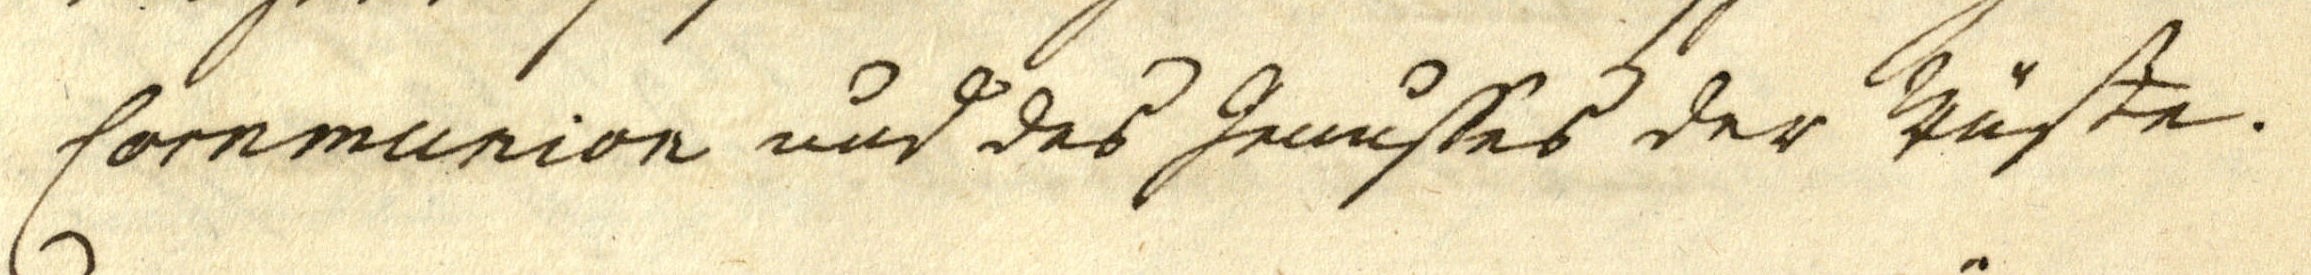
Communion und des Genusses der Wüste¬
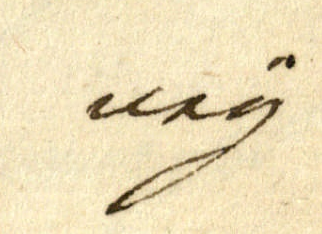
neÿ
